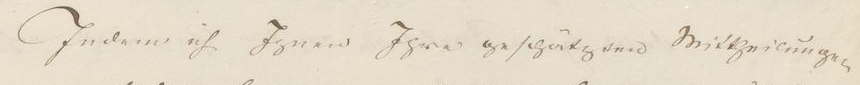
Indem ich Ihnen Ihre geschätzten Mittheilungen
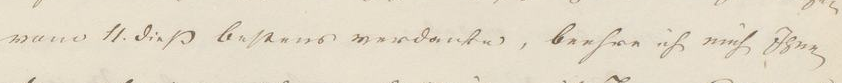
vom 11. dieß bestens verdanke, beehre ich mich Ihnen
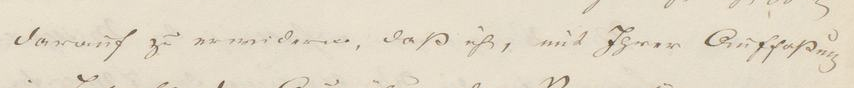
darauf zu erwidern, daß ich, mit Ihrer Auffaßung
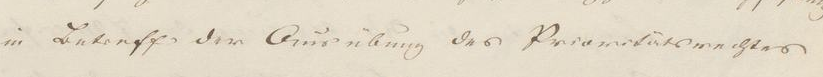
in Betreff der Ausübung des Prioritätsrechtes
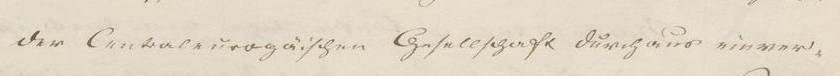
der Centraleuropäischen Gesellschaft durchaus einver-
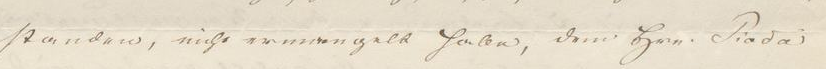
standen, nicht ermangelt habe, dem Hrn. Pioda
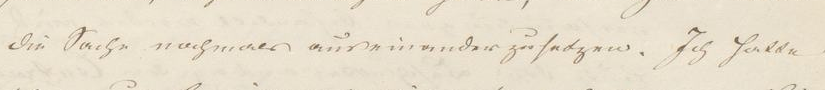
die Sache nochmals auseinanderzusetzen. Ich hatte
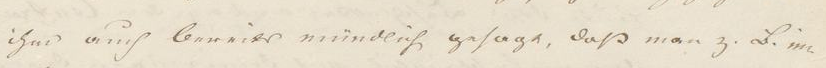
ihm auch bereits mündlich gesagt, daß man z. B. im
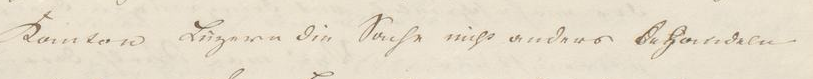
Kanton Luzern die Sache nicht anders behandeln
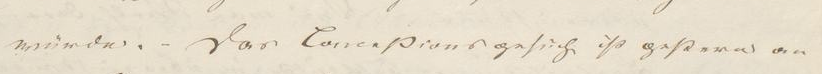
würde. – Das Conceßionsgesuch ist gestern an
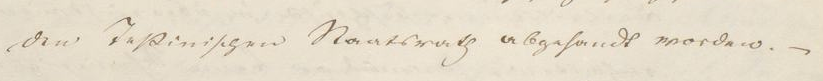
den Teßinischen Staatsrath abgesandt worden. –
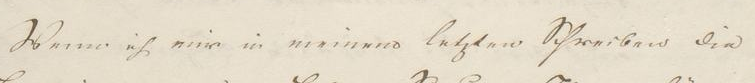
Wenn ich mir in meinem letzten Schreiben die
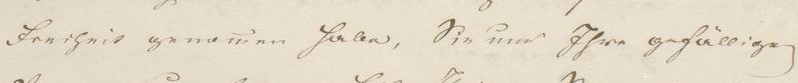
Freiheit genommen habe, Sie um Ihre gefällige
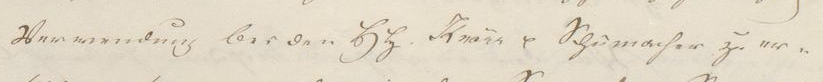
Verwendung bei den HH. Knörr & Schumacher zu er-
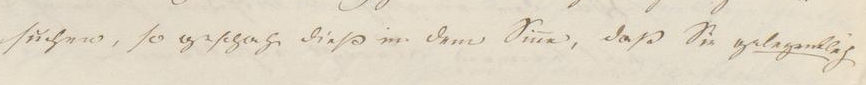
suchen, so geschah dieß in dem Sinne, daß Sie gelegentlich
